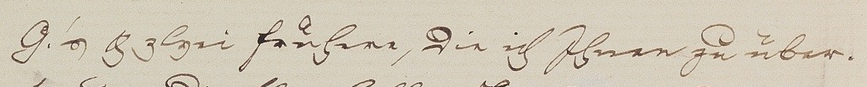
G.'s & zwei frühere, die ich Ihnen zu über-
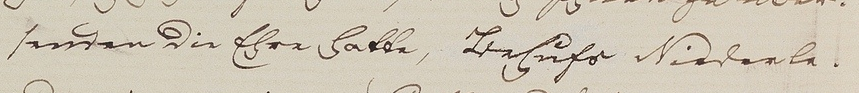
senden die Ehre hatte, Behufs Niederle-
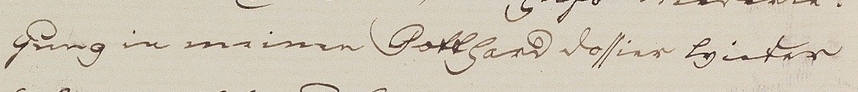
gung in meinen Gotthard Dossier wieder
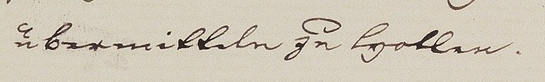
übermitteln zu wollen.
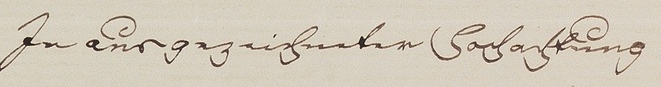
In ausgezeichneter Hochachtung
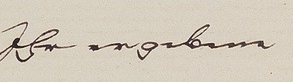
Ihr ergebene
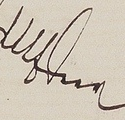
Escher
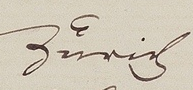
Zürich
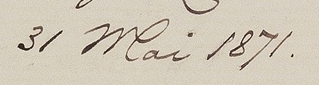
31 Mai 1871.
